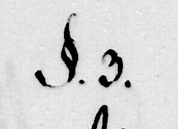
§. 3.
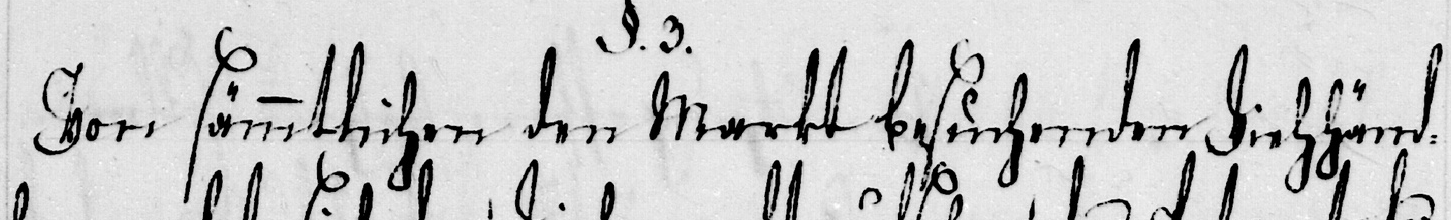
Von sämmtlichen den Markt besuchenden Viehhänd¬
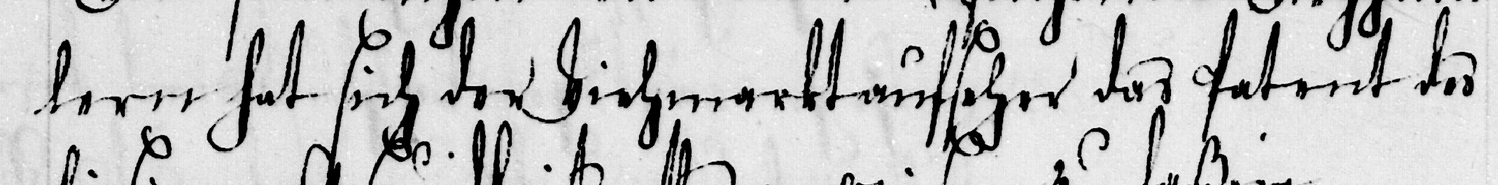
lern hat sich der Viehmarktaufseher das Patent des
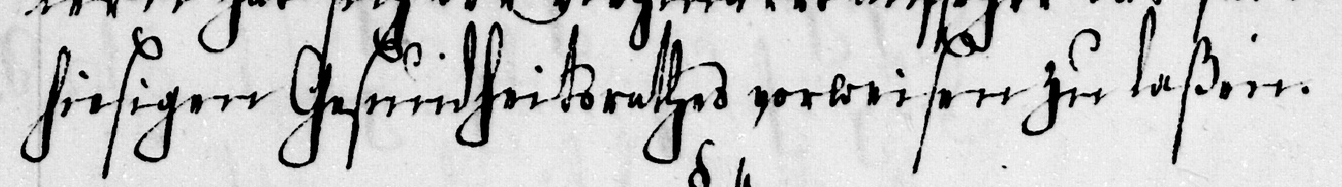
hiesigen Gesundheitsrathes vorweisen zu laßen.
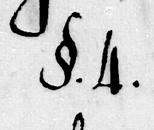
§. 4.
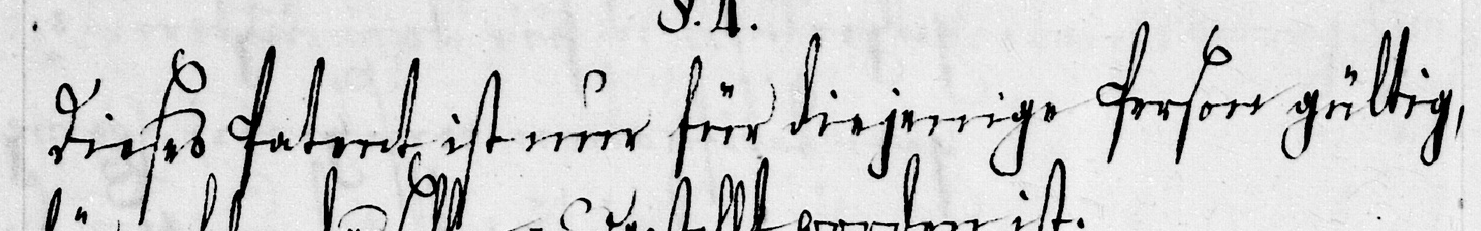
Dieses Patent ist nur für diejenige Person gültig,
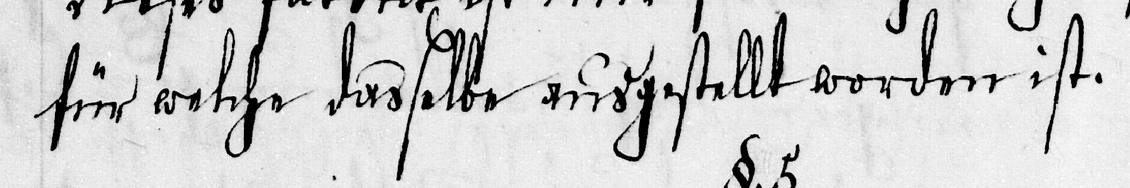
für welche dasselbe ausgestellt worden ist.
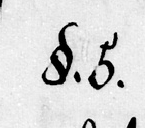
§. 5.
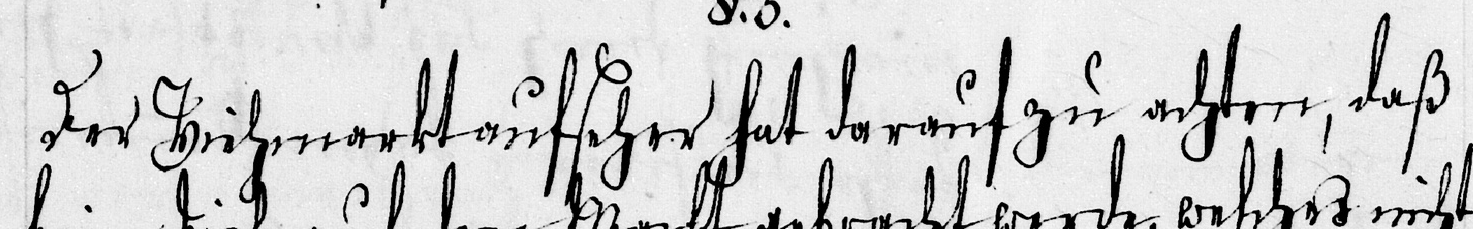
Der Viehmarktaufseher hat darauf zu achten, daß
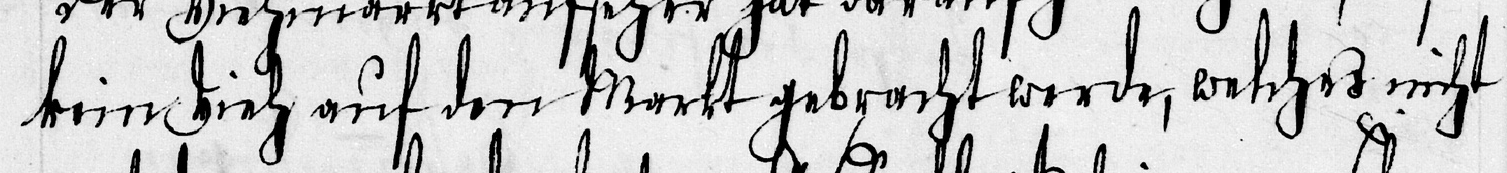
kein Vieh auf den Markt gebracht werde, welches nicht
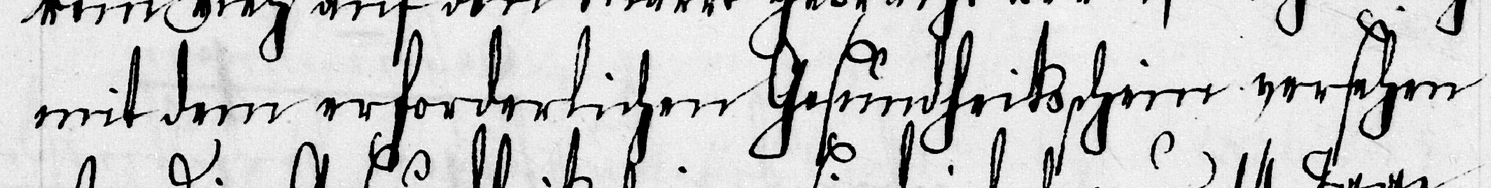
mit dem erforderlichen Gesundheitsschein versehen
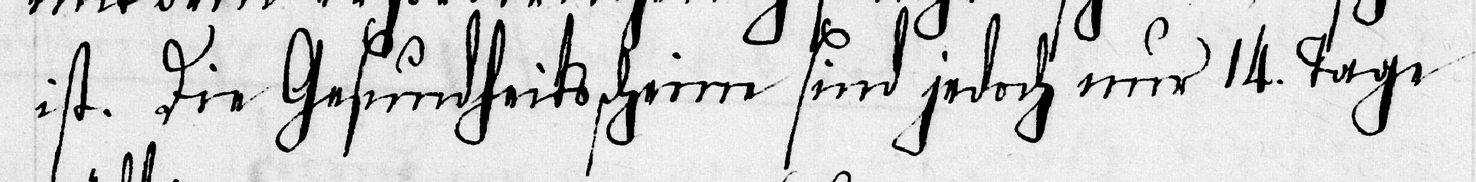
ist. Die Gesundheitsscheine sind jedoch nur 14. Tage
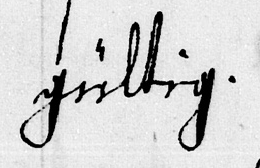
gültig.
